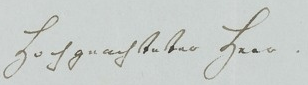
Hochgeachteter Herr.
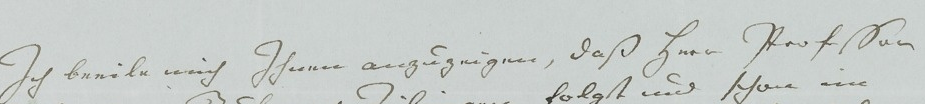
Ich beeile mich Ihnen anzuzeigen, daß Herr Professor
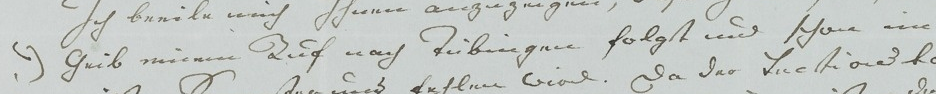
Geib einem Ruf nach Tübingen folgt und schon im
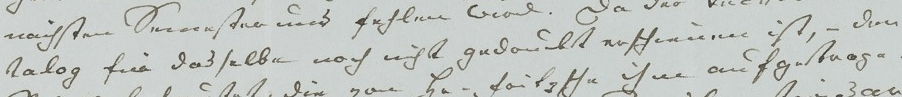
talog für dasselbe noch nicht gedruckt erschienen ist, – der
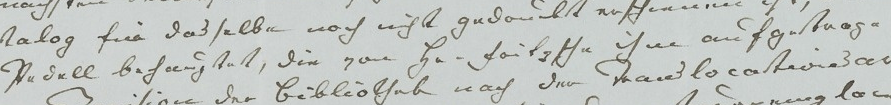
Pedell behauptet, die von Hr. Fritzsche ihm aufgetrage-
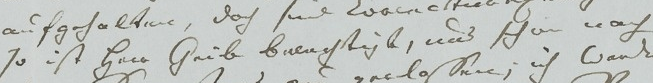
so ist Herr Geib berechtigt, uns schon nach
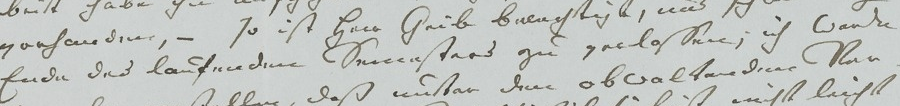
Ende des laufenden Semesters zu verlassen; ich werde
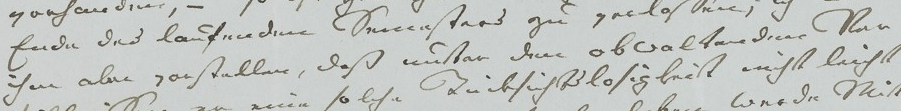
ihm aber vorstellen, daß außer dem obwaltenden Ver-
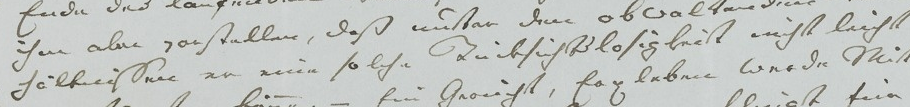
hältnisse er eine solche Rücksichtslosigkeit nicht leicht
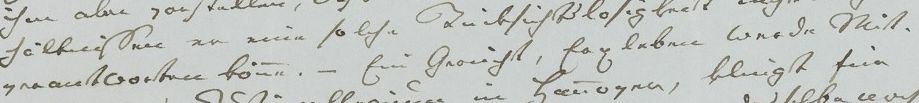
verantworten könne. – Ein Gerücht, Erxleben werde Mit-
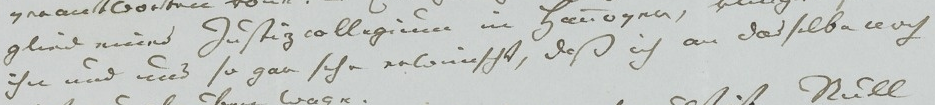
ihn und uns so gar sehr erwünscht, daß ich an dasselbe noch
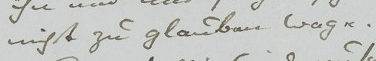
nicht zu glauben wage.
